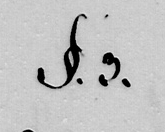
§. 3.
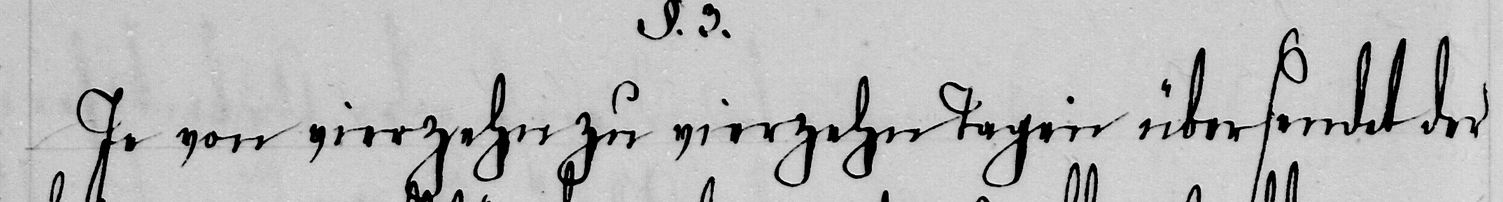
Je von vierzehn zu vierzehn Tagen übersendet der
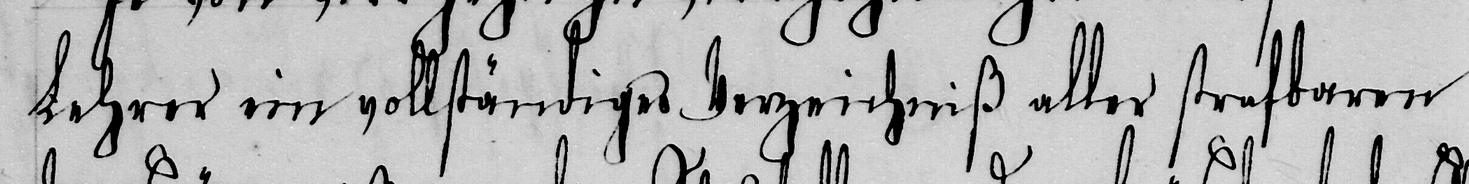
Lehrer ein vollständiges Verzeichniß aller strafbaren
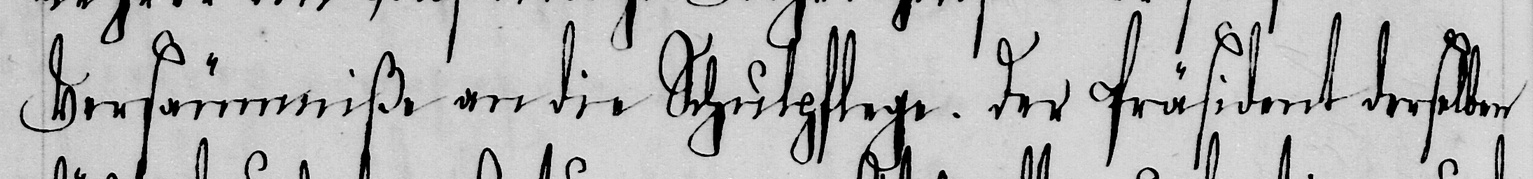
Versäumniße an die Schulpflege. Der Präsident derselb¬
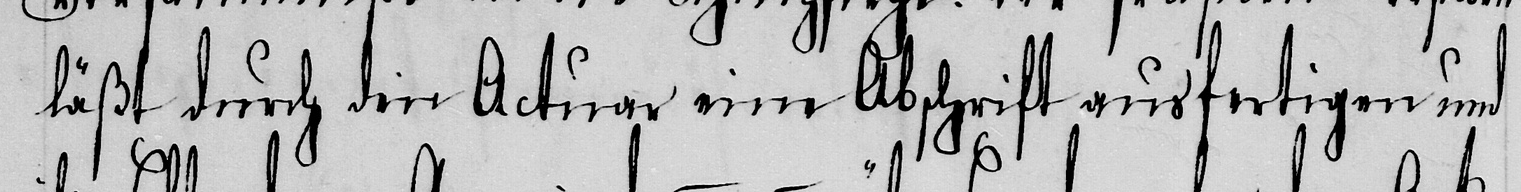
läßt durch den Actuar eine Abschrift ausfertigen und
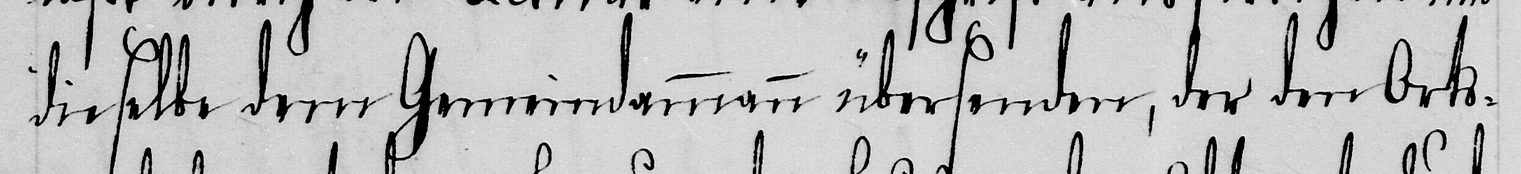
dieselbe dem Gemeindammann übersenden, der den Orts¬
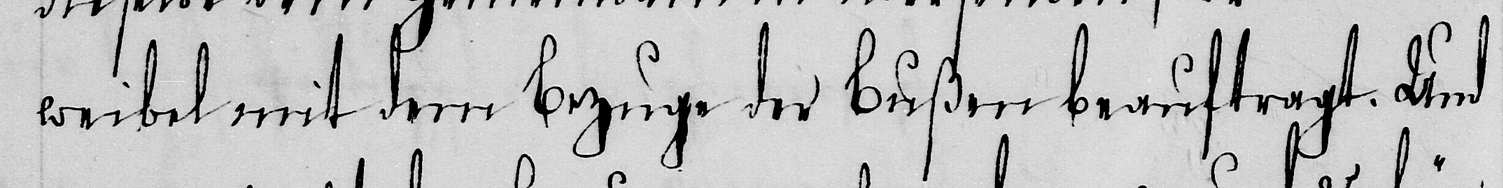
weibel mit dem Bezuge der Bußen beauftragt. Und
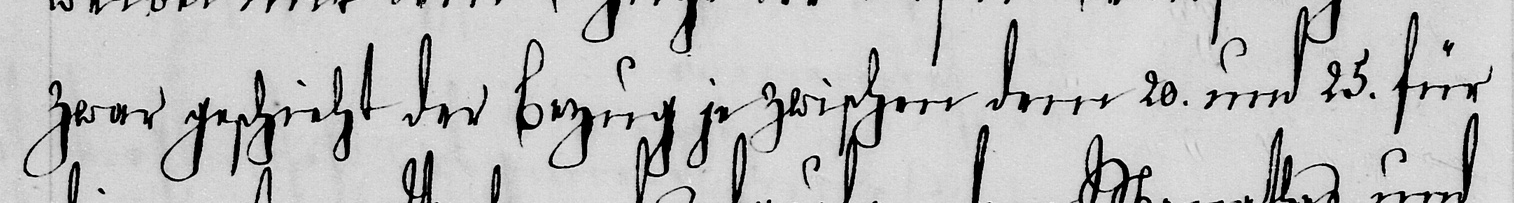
zwar geschieht der Bezug je zwischen dem 20. und 25. für
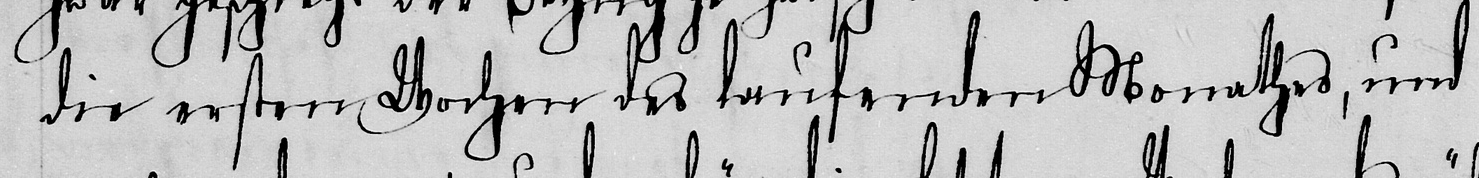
die ersten Wochen des laufenden Monathes, und
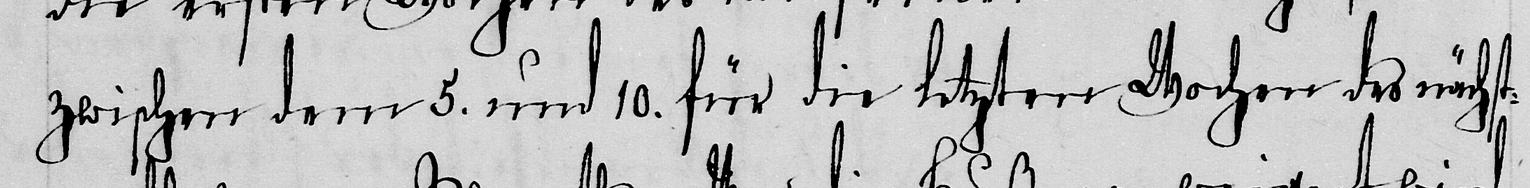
zwischen dem 5. und 10. für die letzten Wochen des näch¬
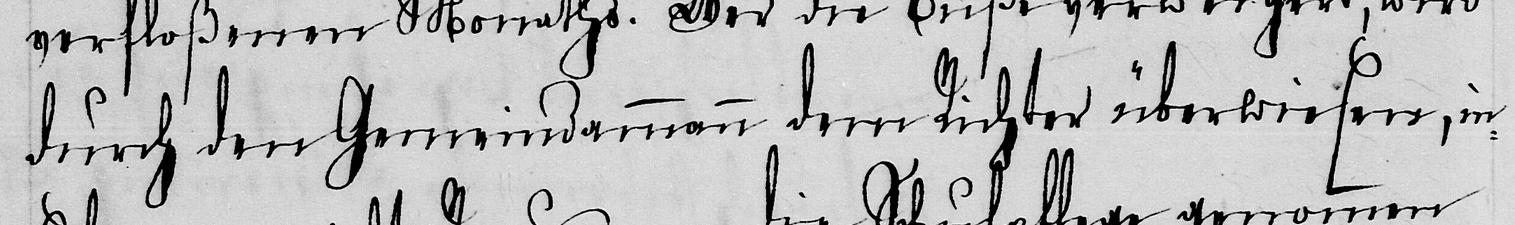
durch den Gemeindammann dem Richter überwiesen, in
